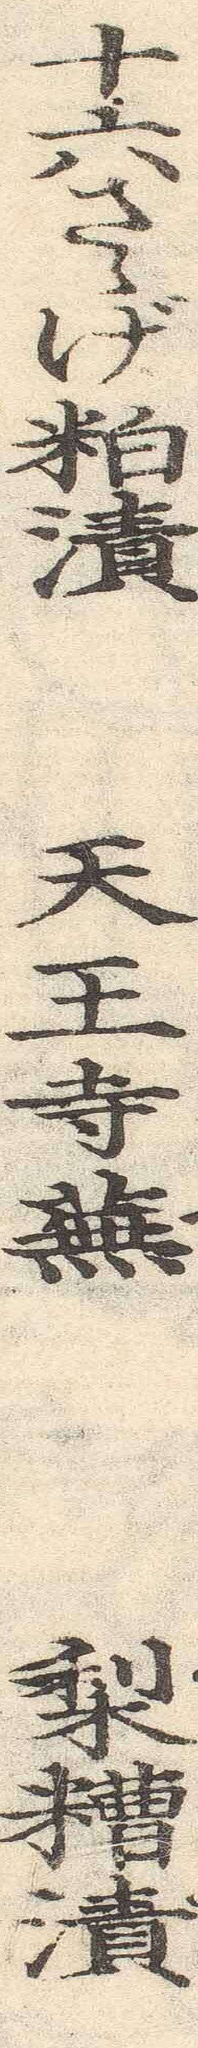十六さゝげ粕漬天王寺蕪梨糟漬
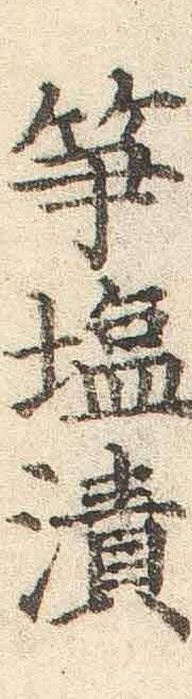筍塩漬
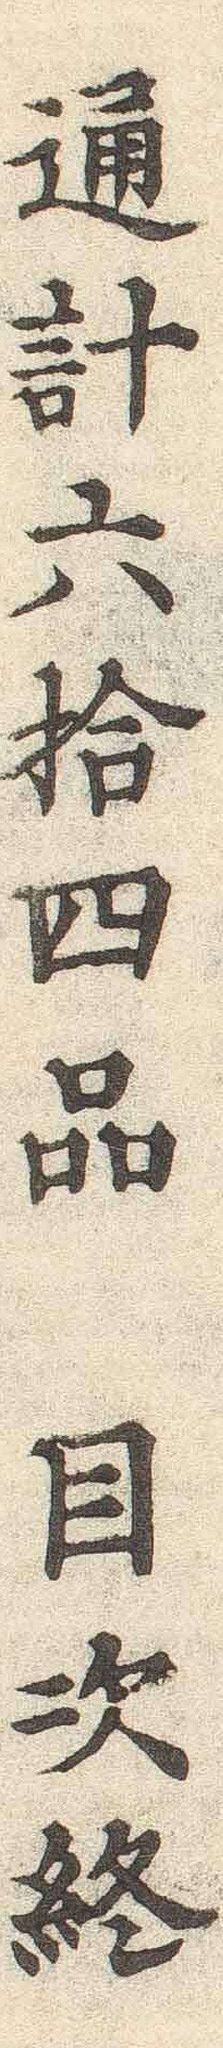通計六拾四品目次終

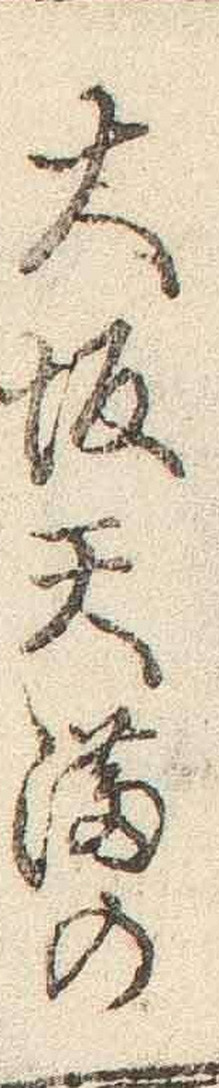大坂天満の
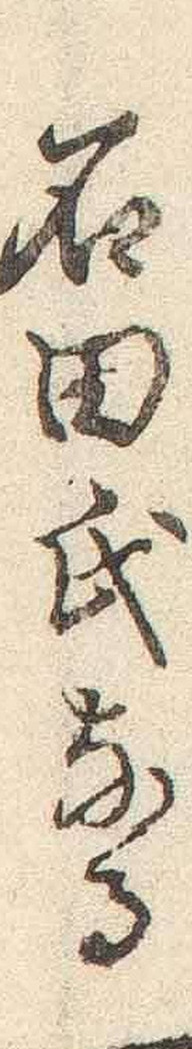石田氏なる
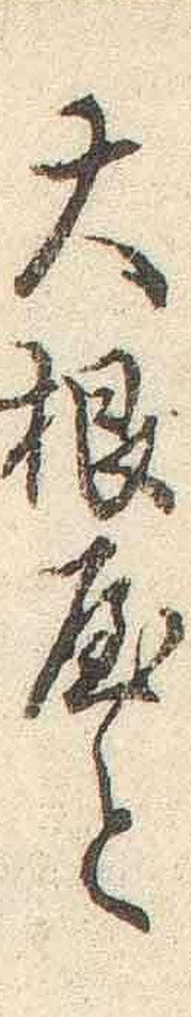大根屋と
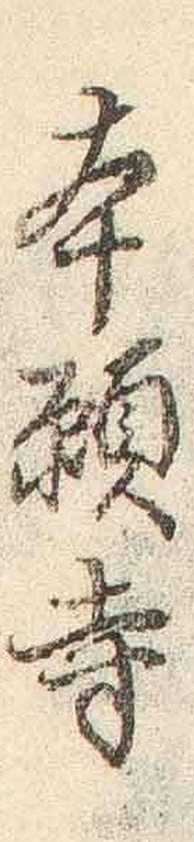本願寺
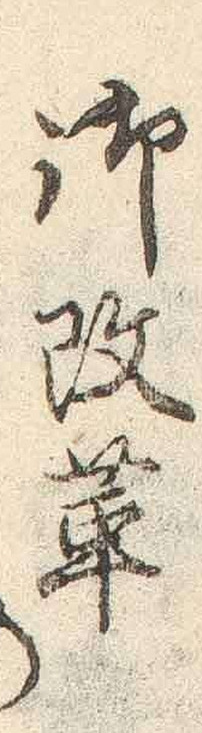御改革
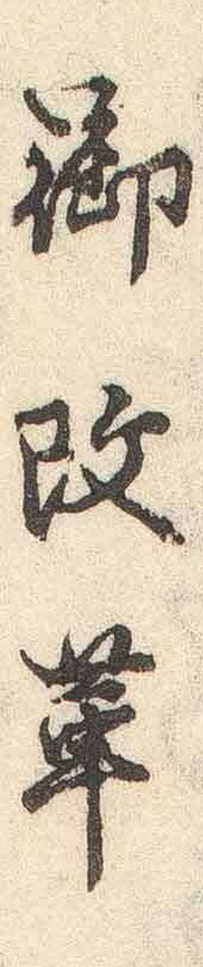御改革
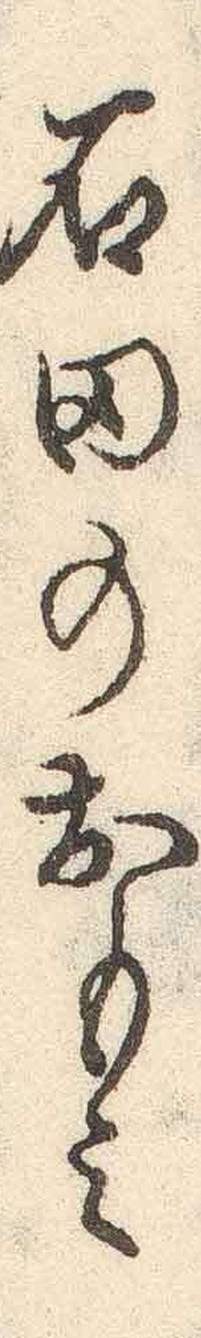石田のおもみ
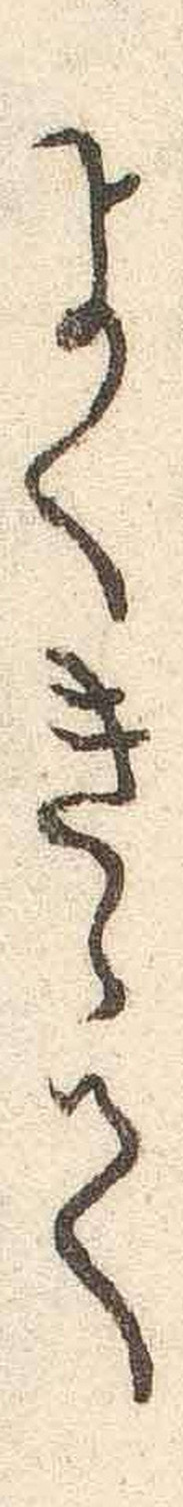よくきゝて
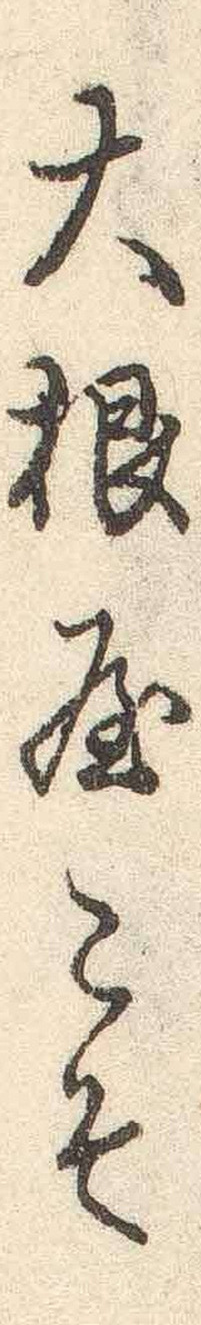大根屋こそ
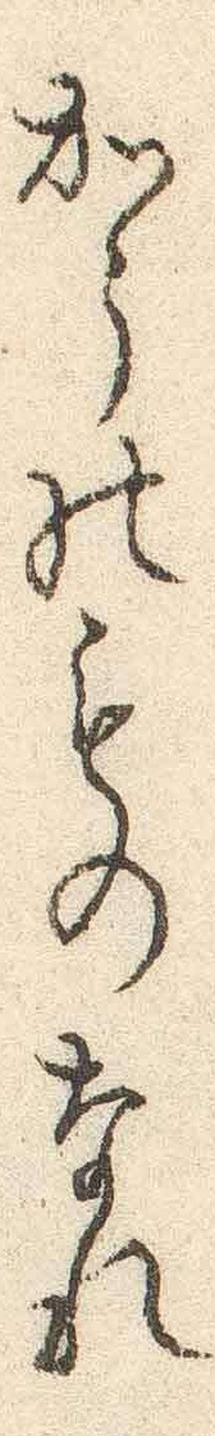かうのものなれ
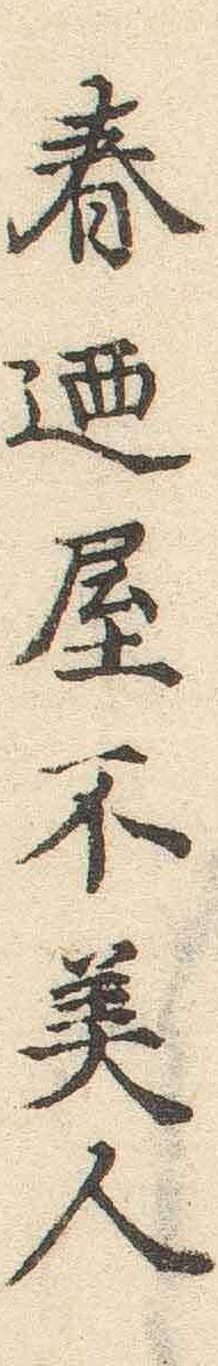春迺屋不美人

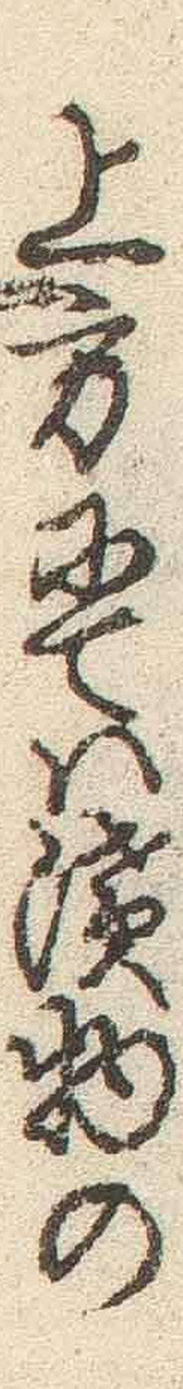上方にては漬物の
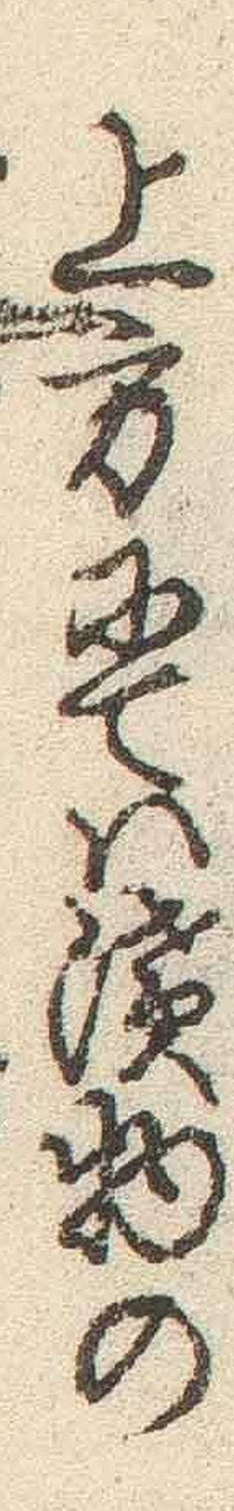上方にては漬物の
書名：四季漬物塩嘉言
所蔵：東京学芸大学附属図書館 国文学研究資料館
